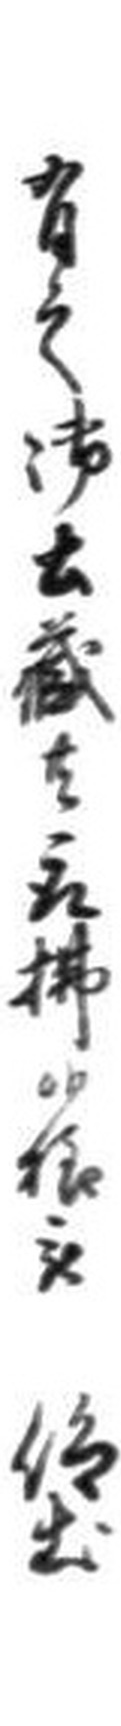有之御土蔵共取払候様被仰出
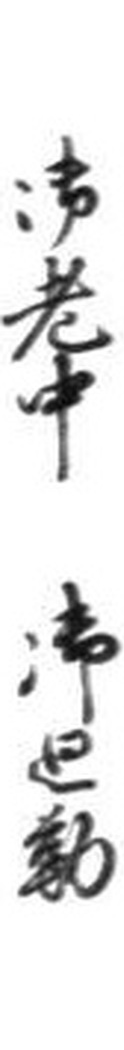御老中御廻勤

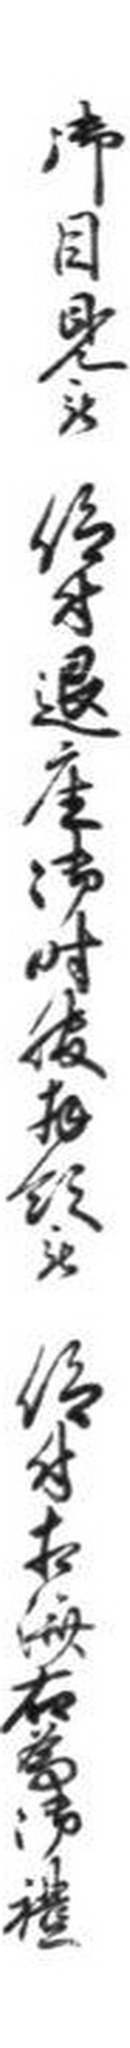御目見被仰付退座御時服拝領被仰付相済右為御礼
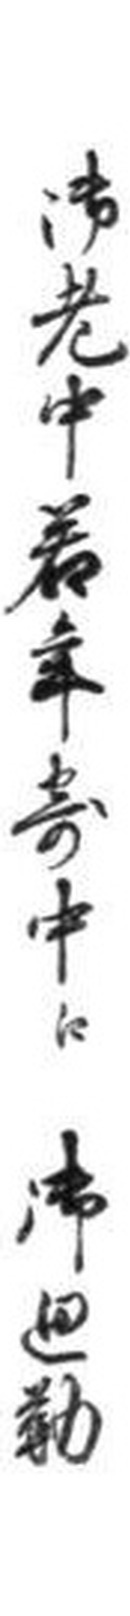御老中若年寄中江御廻勤
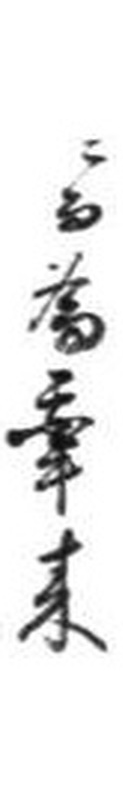ニ而為牽来
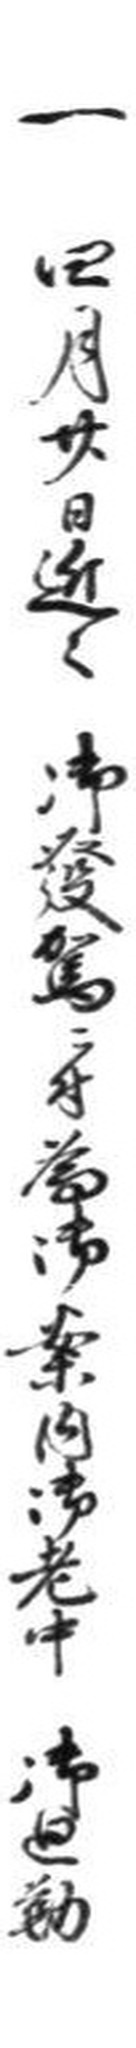一四月廿日近々御発駕ニ付為御案内御老中御廻勤
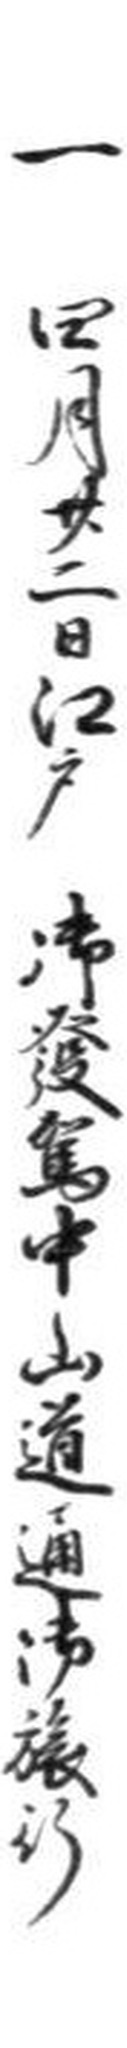一四月廿二日江戸御発駕中山道通御旅行
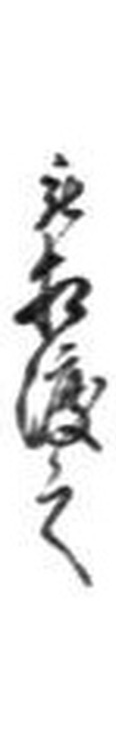被相渡之
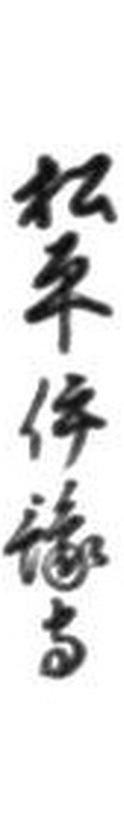松平伊予守
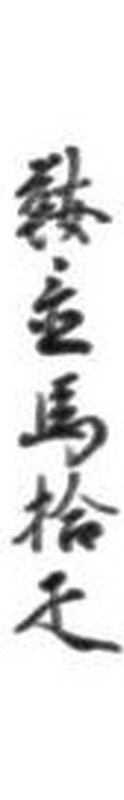鞍置馬拾疋
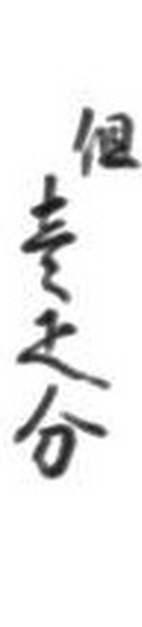但壱疋分
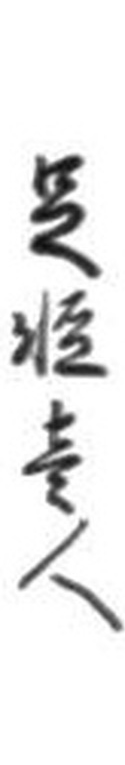足軽壱人
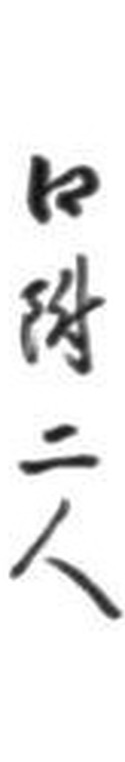口付二人
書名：家譜 三十三 吉邦公 享保四年
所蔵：福井県文書館 Fukui Prefectural Archives
